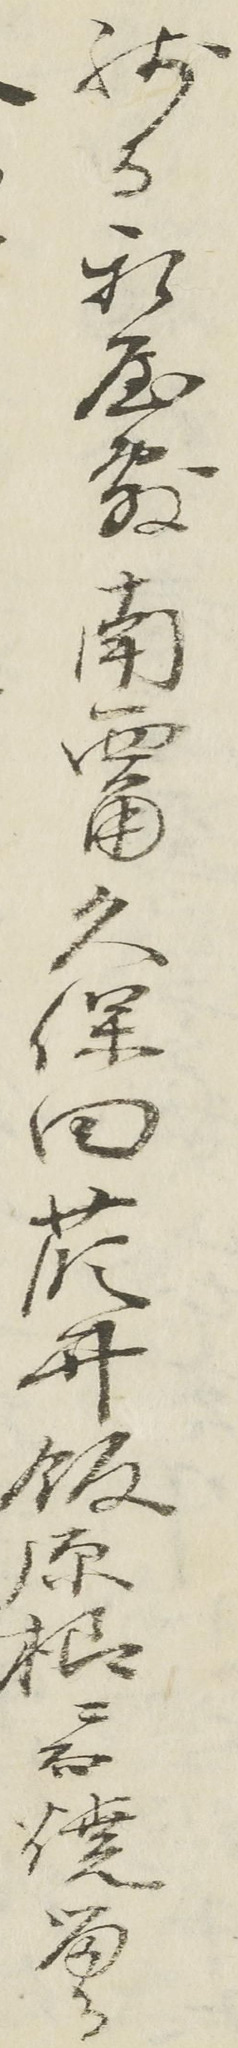残る新屋敷南西角久保田葭井飯原様ニ而焼留る
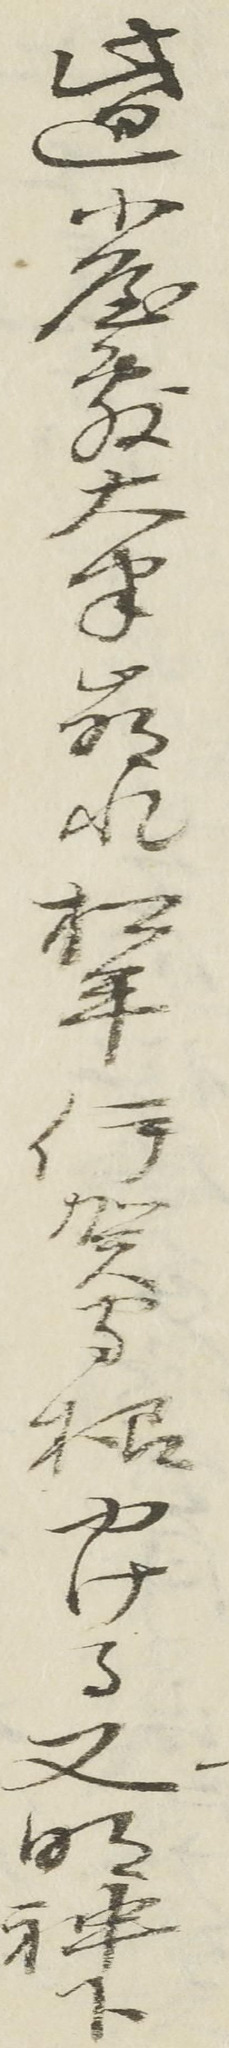此辺小屋敷大半崩れ松平伊賀守様やける又明神下
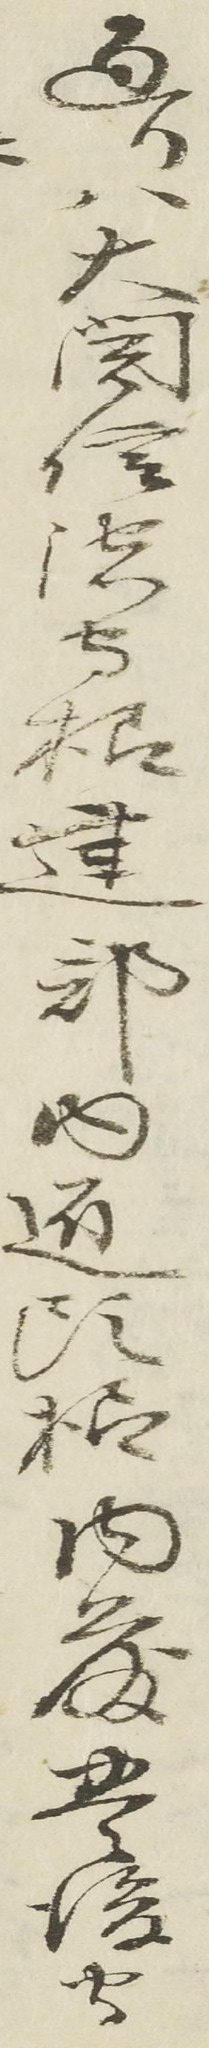通りハ大関信濃守様建部内匠頭様内藤豊後守
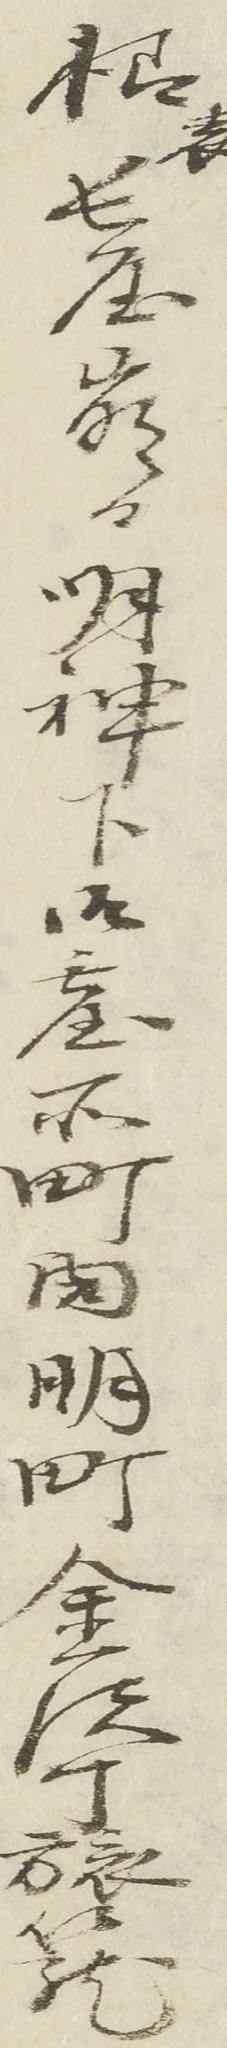様表長屋崩る明神下御台所町同朋町金沢丁旅籠
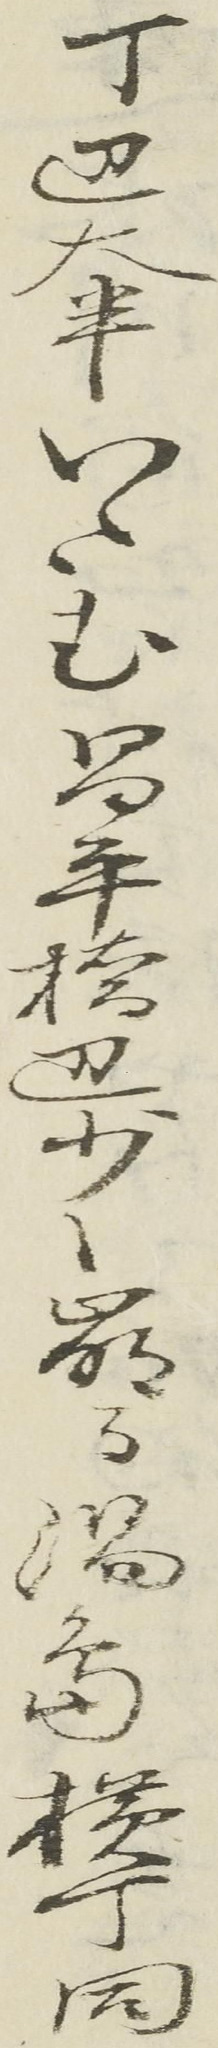丁辺大半いたむ昌平橋辺少し崩る湯島横丁同
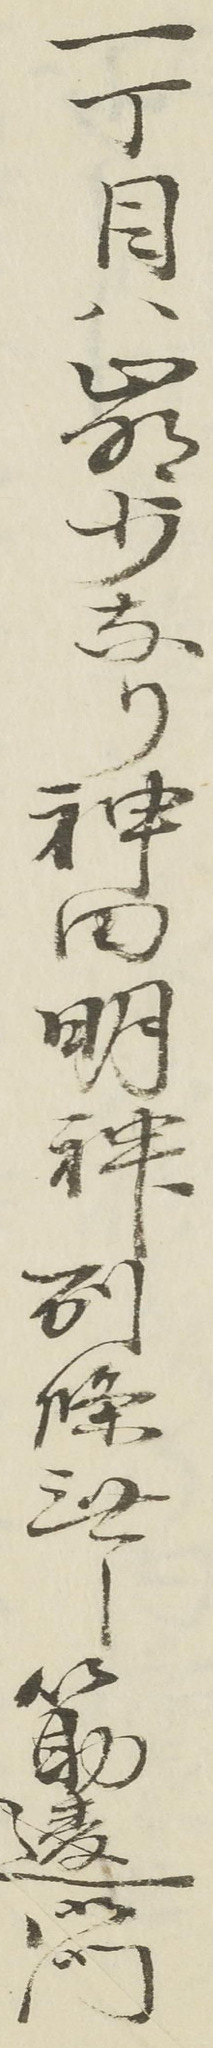一丁目ハ崩少なり神田明神別條無し筋違御門
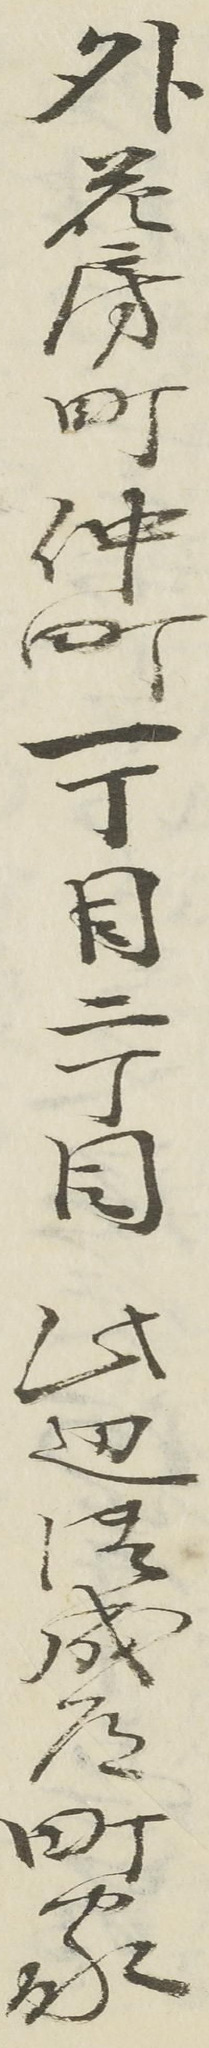外花房町仲町一丁目二丁目此辺御成道町家
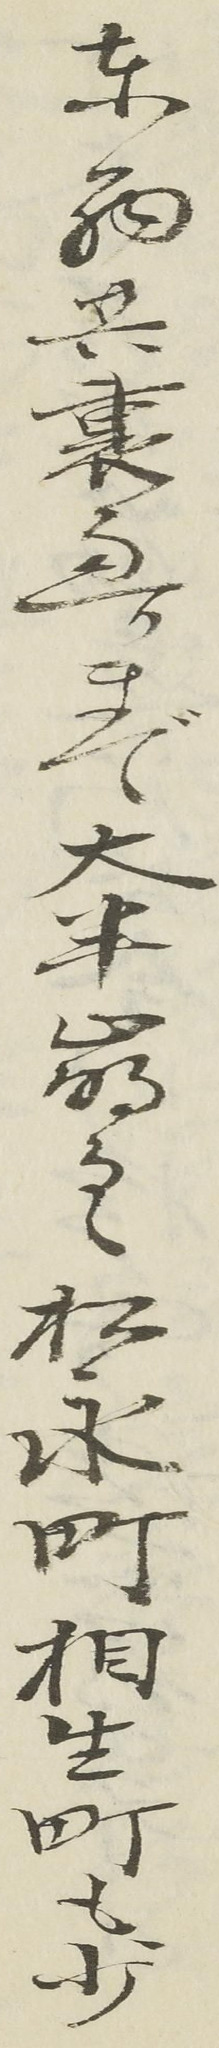東西共裏通りまで大半崩るゝ松永町相生町も少
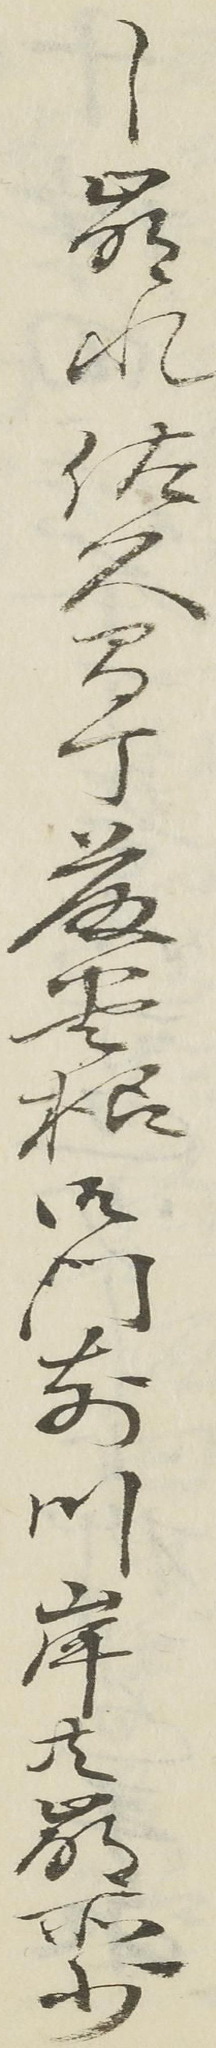し崩れ佐久間丁藤豊様御門前川岸共崩所少
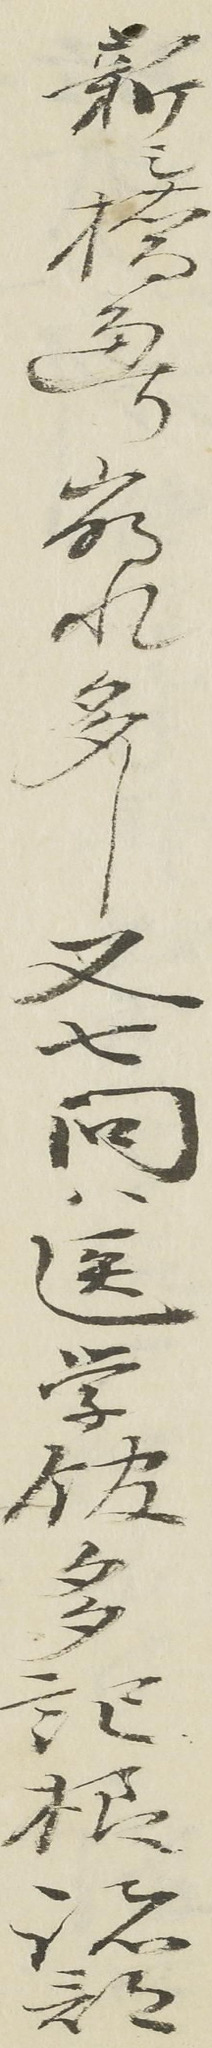新シ橋通り崩れ多し又七問ハ医学館多記様諸部
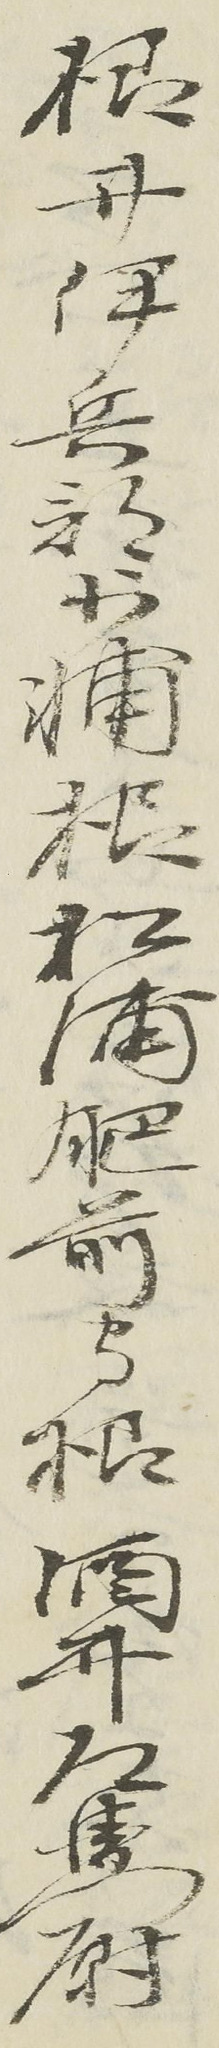様井伊兵部少輔様松浦肥前守様酒井左衛門尉
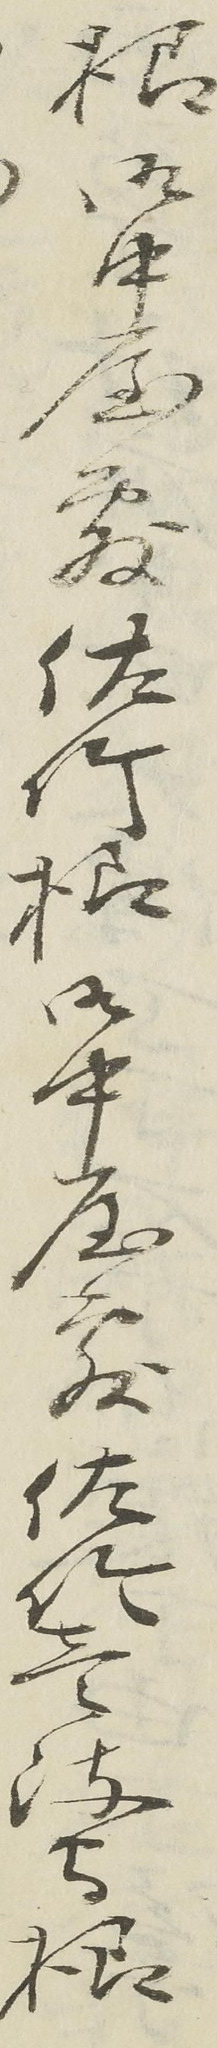様御中屋敷佐竹様御中屋敷佐竹壱岐守様
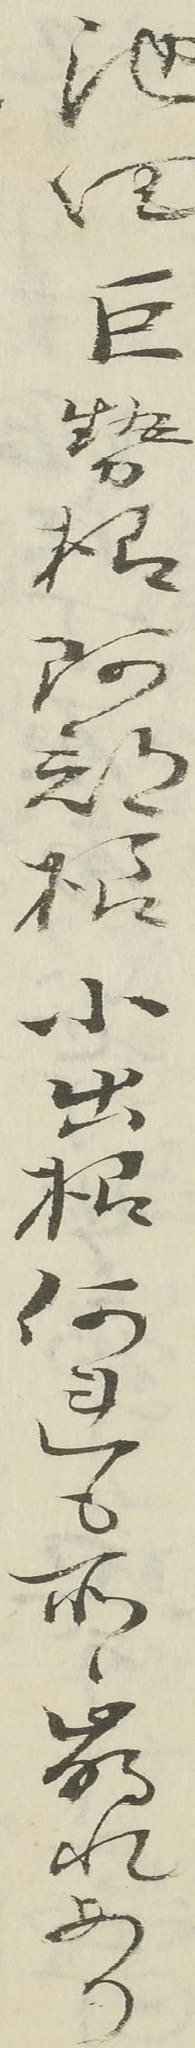池田巨勢様阿部様小出様何れも所〻崩れあり
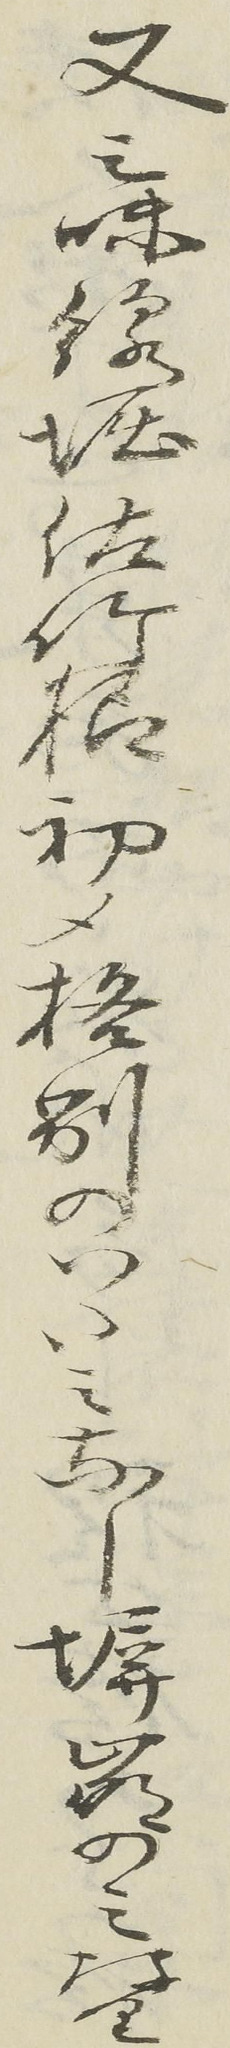又三味線堀佐竹様初メ格別のいたミなし塀崩のミなり
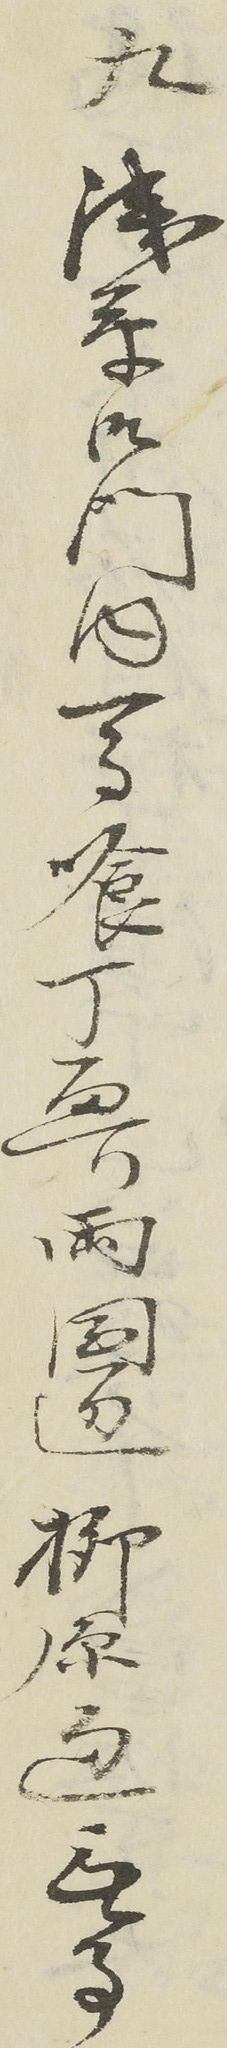九浅草御門内馬喰丁通り両国辺柳原通無事

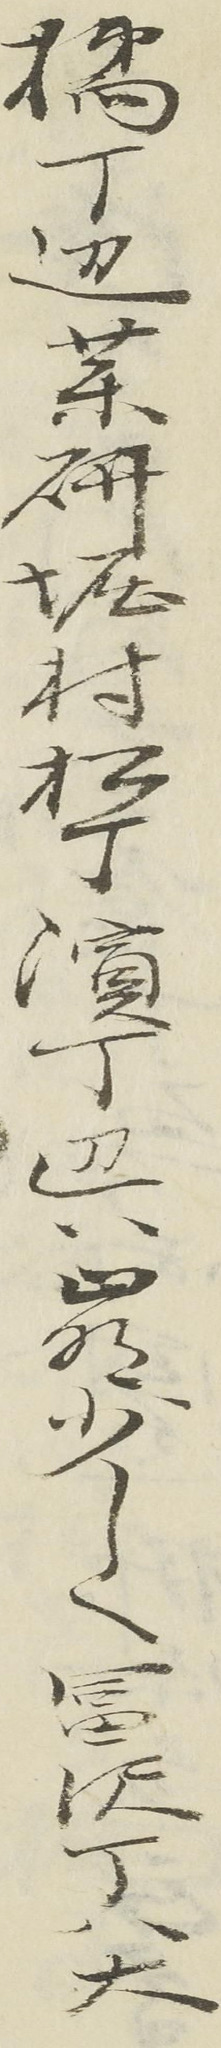橘丁辺薬研堀村松丁濱丁辺ハ崩少し也富沢丁ハ大
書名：安政乙卯江戸大地震筆記　安政丙辰八月大阪大雷雨之記追加　安政三辰年七月松前辺大地震并八月大風雨記録
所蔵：東京大学地震研究所図書室 Earthquake Research Institute Library, The University of Tokyo, JAPAN
